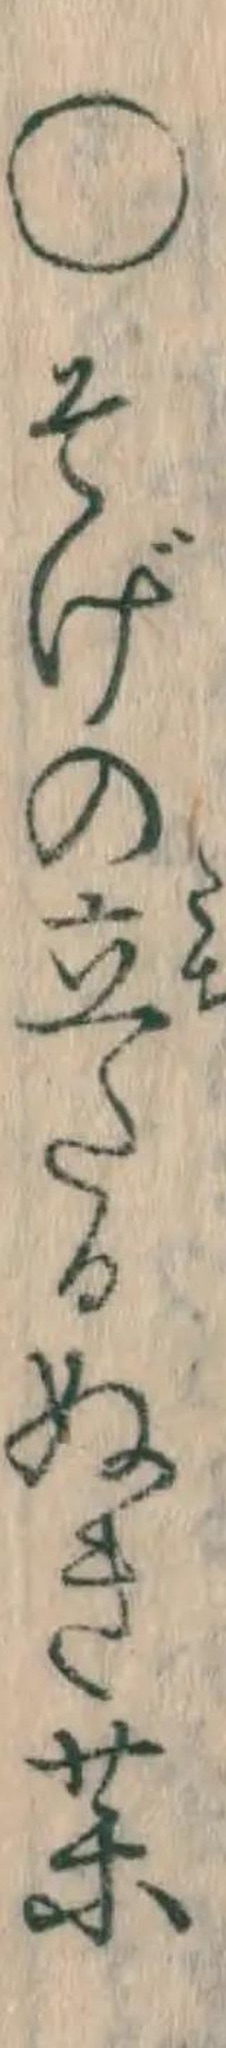○そげの立たるぬき薬

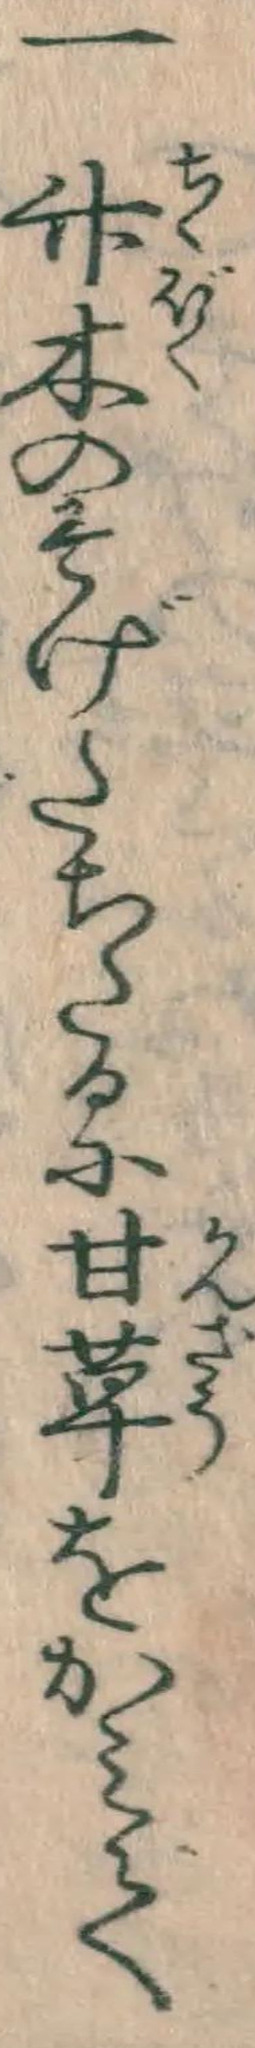一竹木のそげたちたるに甘草をかみて
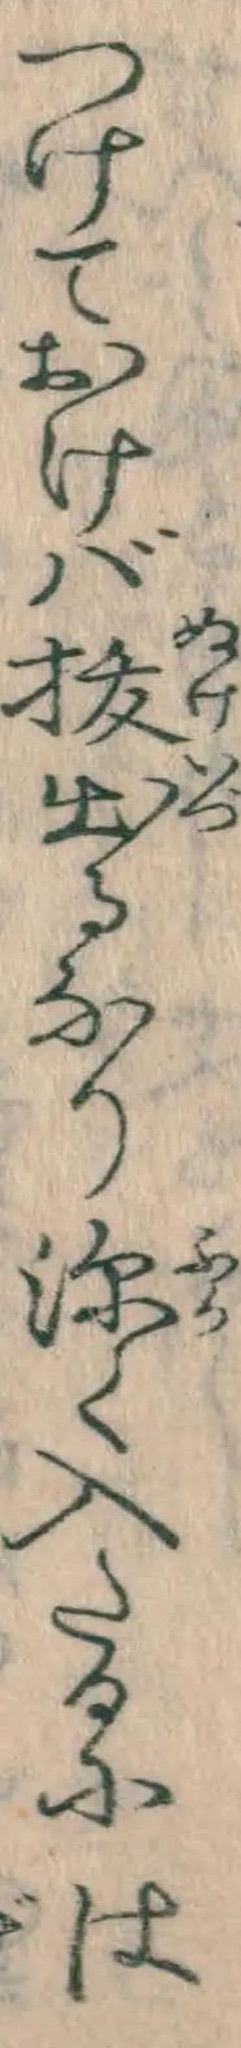つけておけば抜出るなり深く入たるには
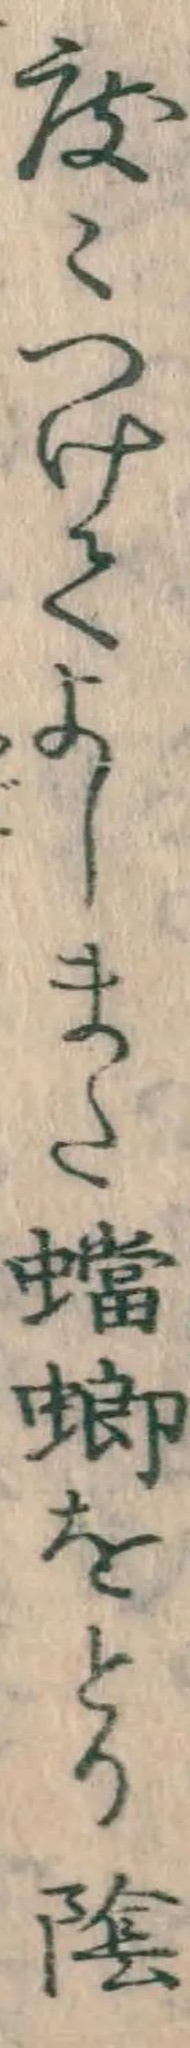度々つけてよしまた蟷螂をとり陰
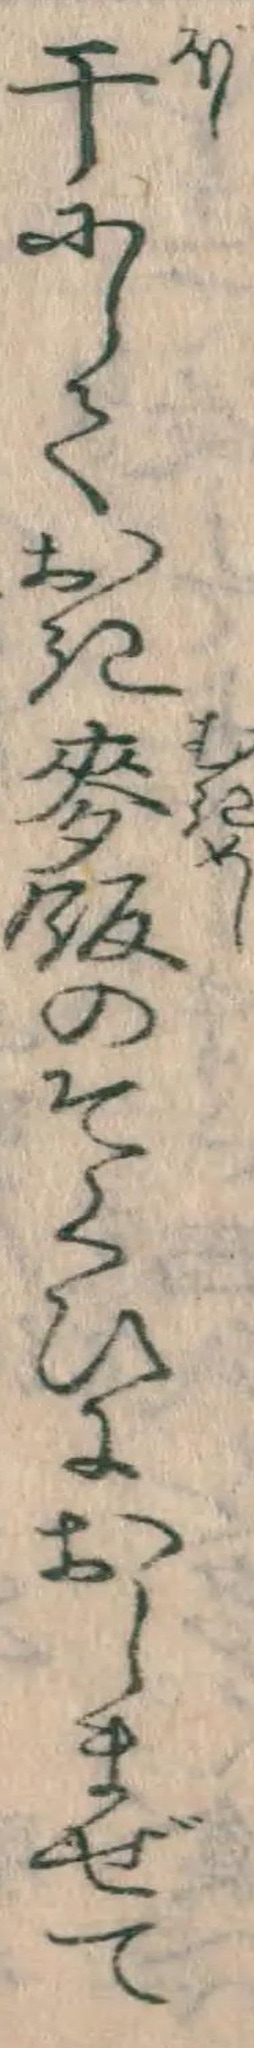干にしておき麦飯のそくひにおしまぜて
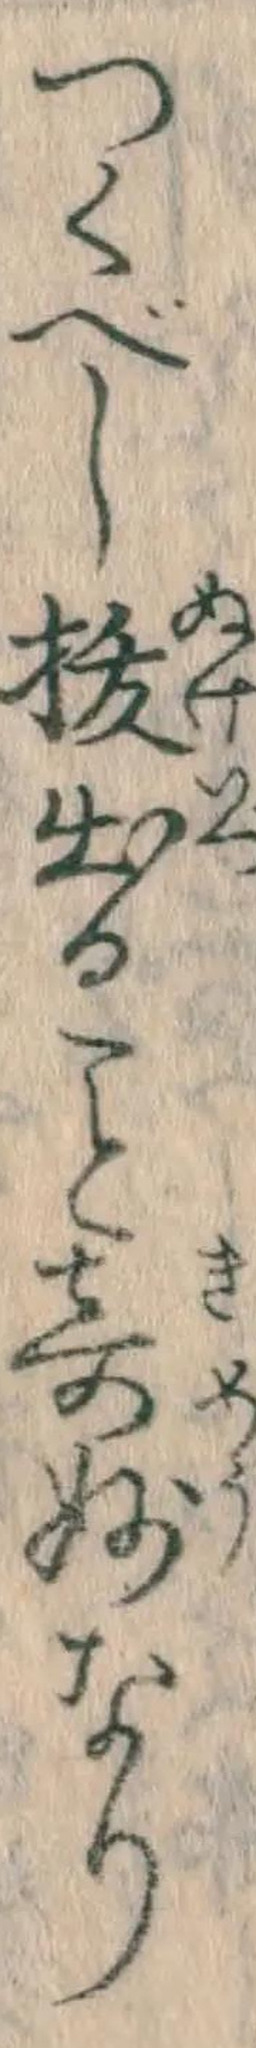つくべし抜出ること奇妙なり
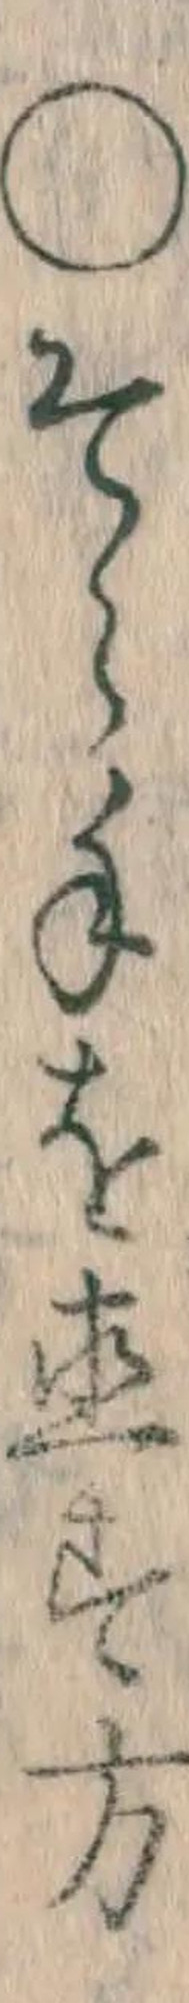○そら手を直す方
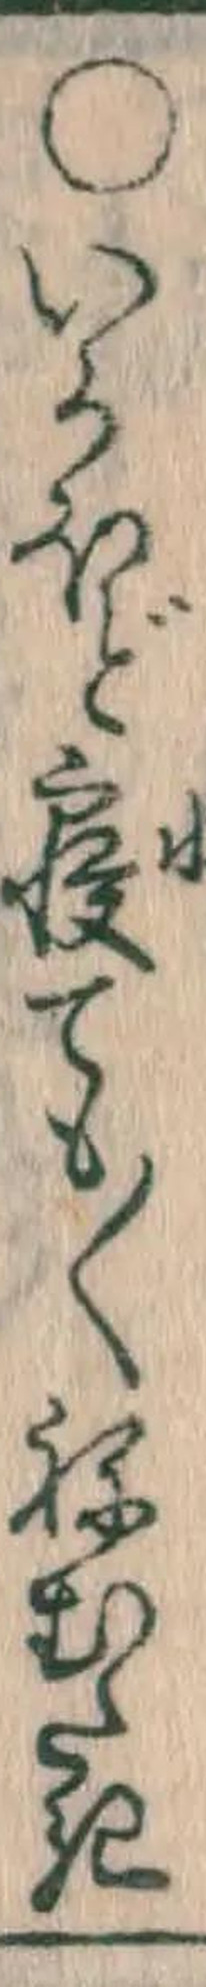○いかほど寝ても〳〵ねむたき
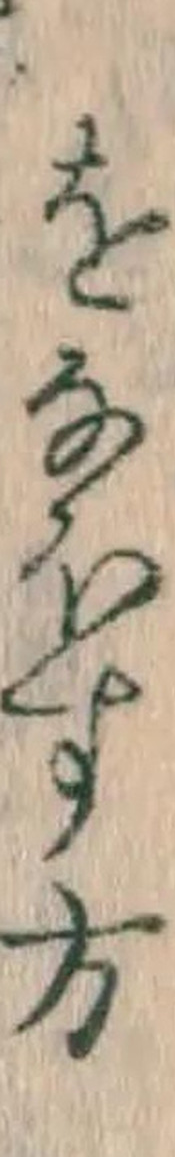をなほす方
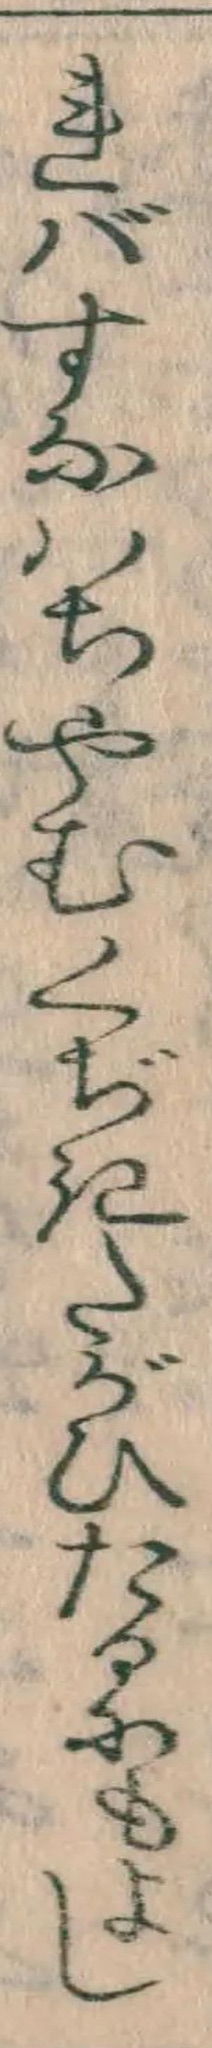ればすなはちやむくぢきたがひたるにもよし
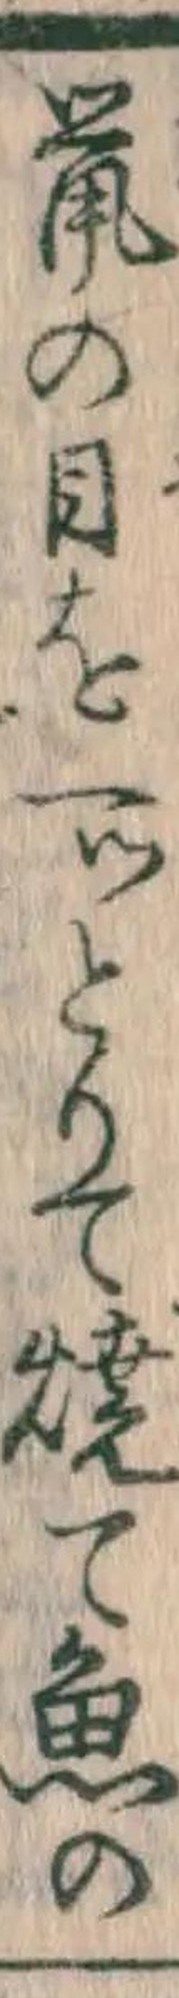鼠の目を一ッとりて焼て魚の
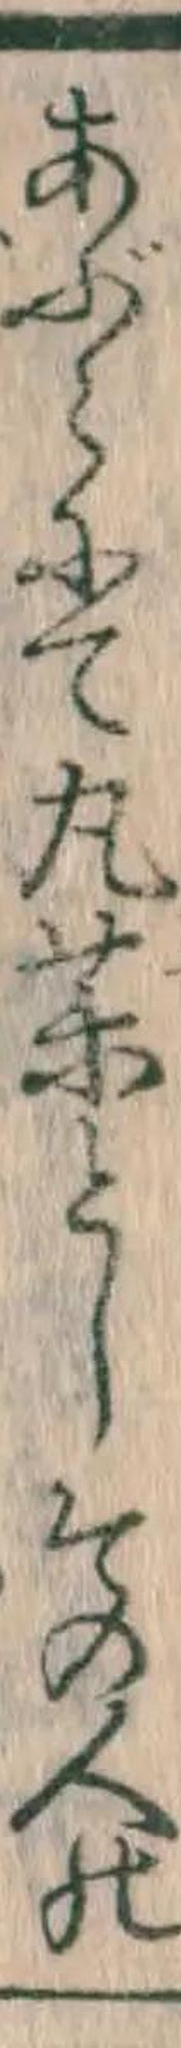あぶらにて丸薬としその人の
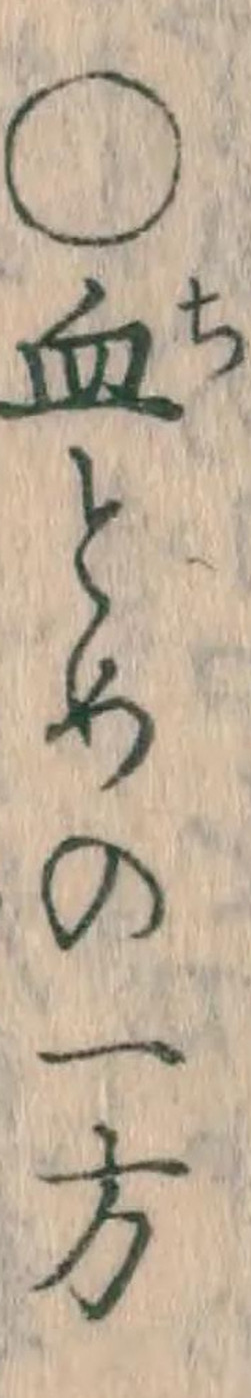○血とめの一方
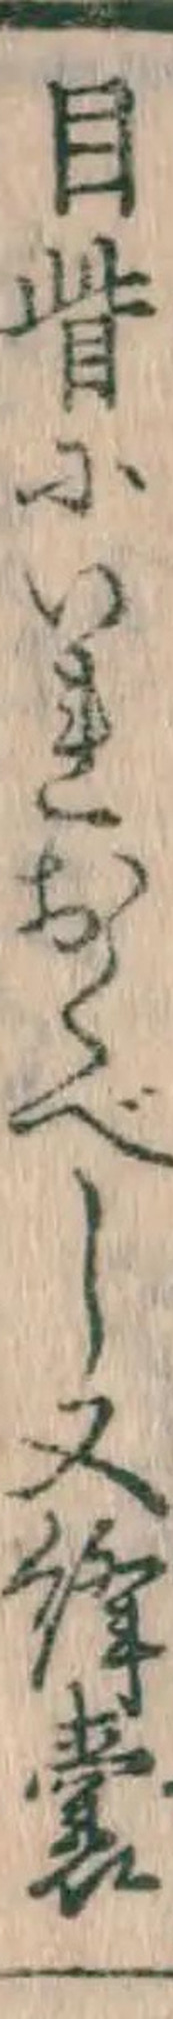目眥にいれおくべし又絳嚢
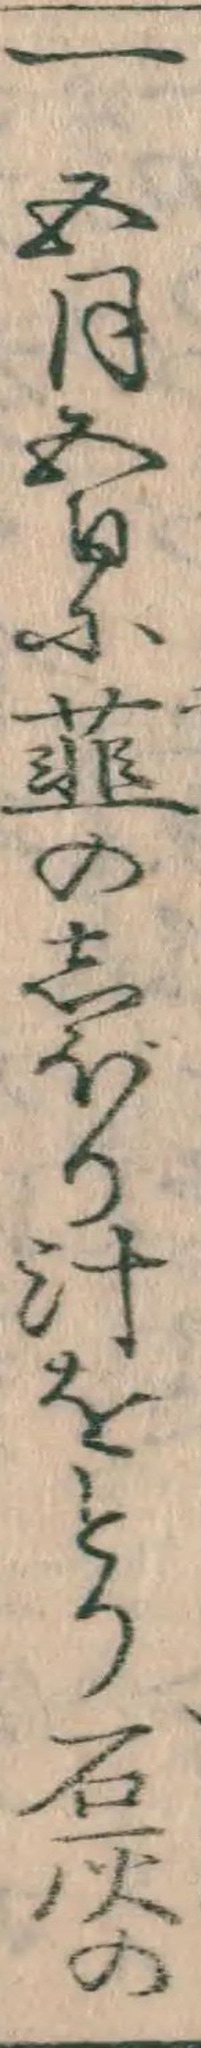一五月五日に韮のしぼり汁をとり石灰の
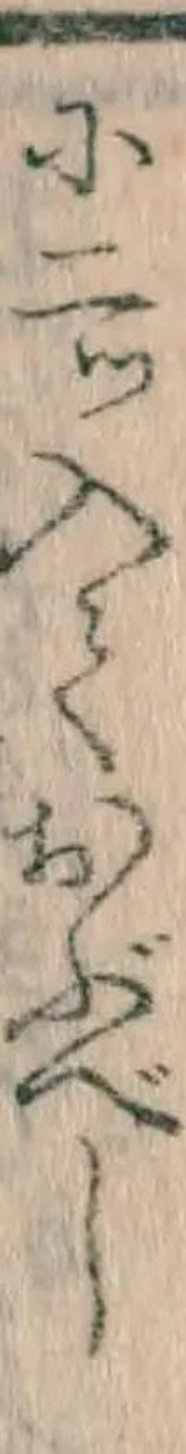に二ッ入ておぶべし
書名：広益秘事大全 3巻. [4]
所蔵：国立国会図書館 National Diet Library, JAPAN
